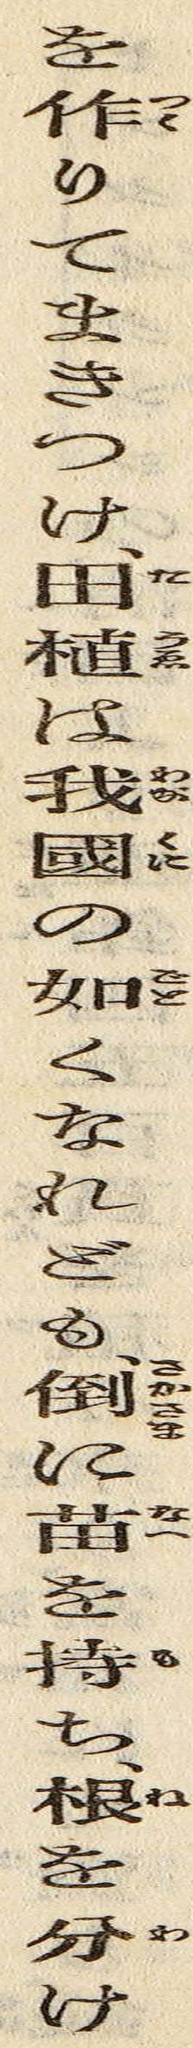を作りてまきつけ、田植は我国の如くなれども、倒に苗を持ち、根を分け
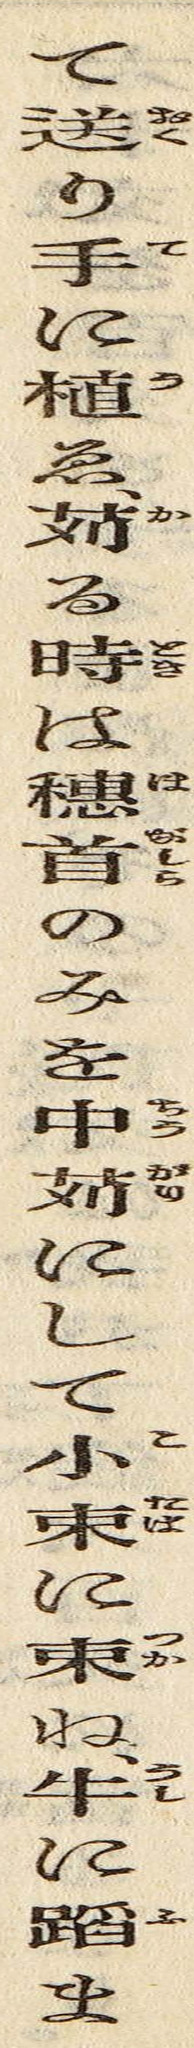て送り手に植ゑ、苅る時は穂首のみを中苅にして小束に束ね、牛に蹈ま
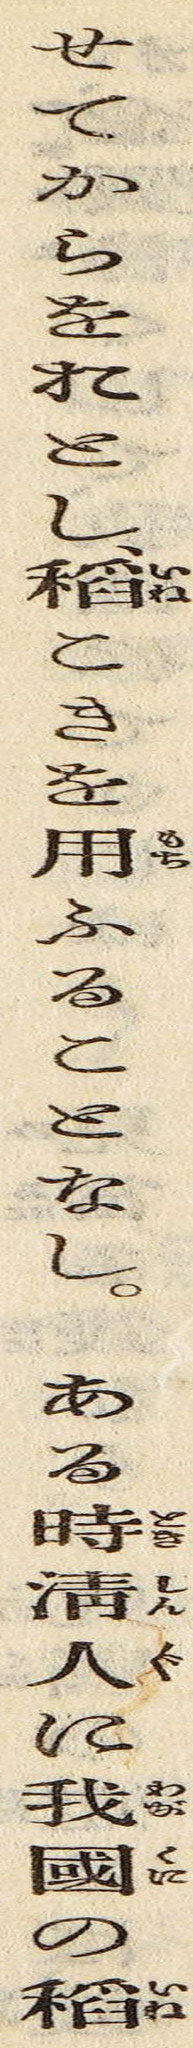せてからをおとし、稲こきを用ふることなし。ある時清人に我国の稲
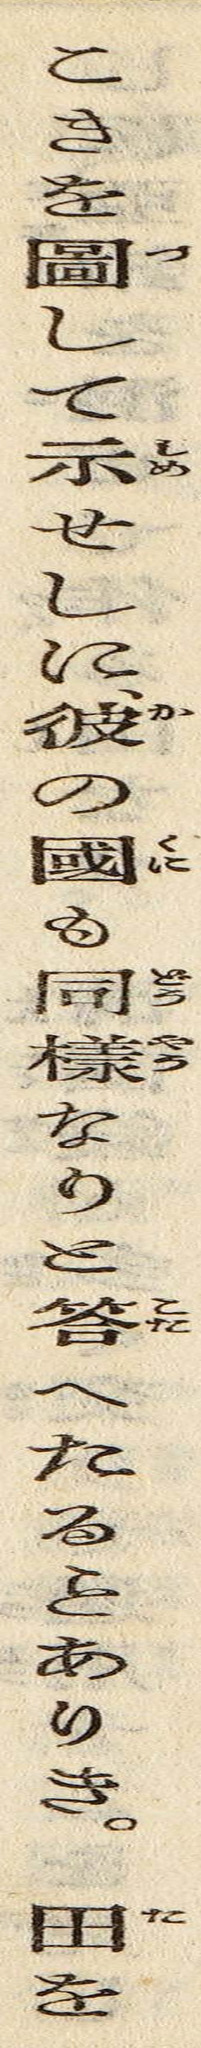こきを図して示せしに、彼の国も同様なりと答へたることありき。田を
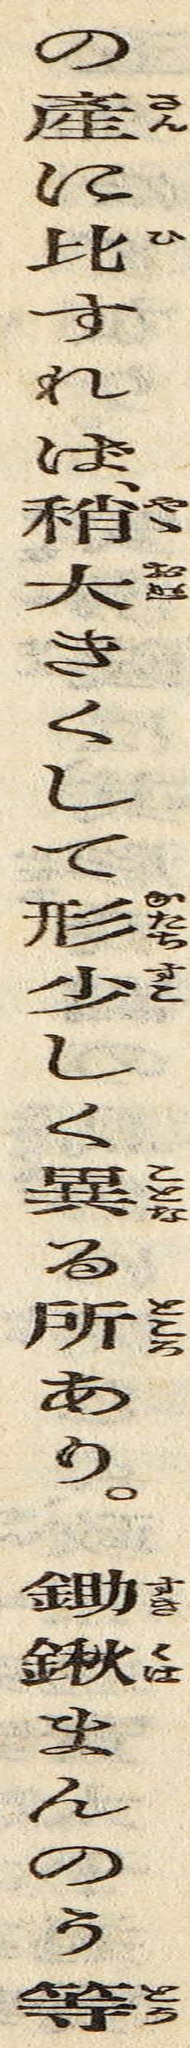の産に比すれば、稍大きくして形少しく異る所あり。鋤鍬まんのう等
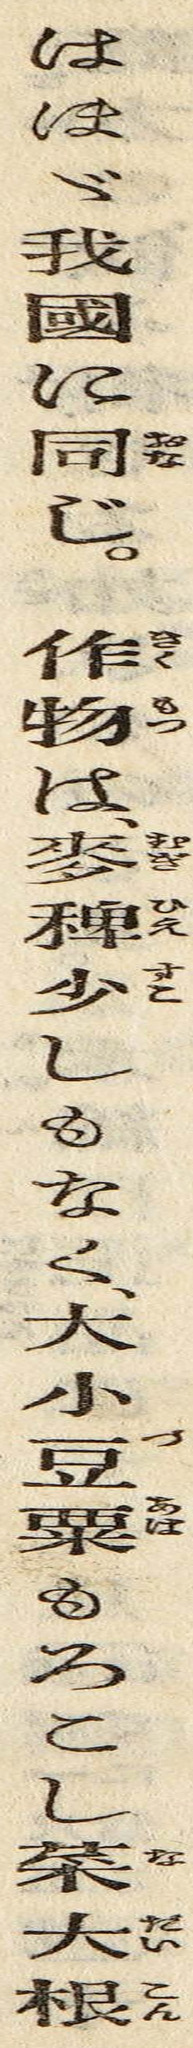はほゞ我国に同じ。作物は、麦稗少しもなく、大小豆粟もろこし菜大根
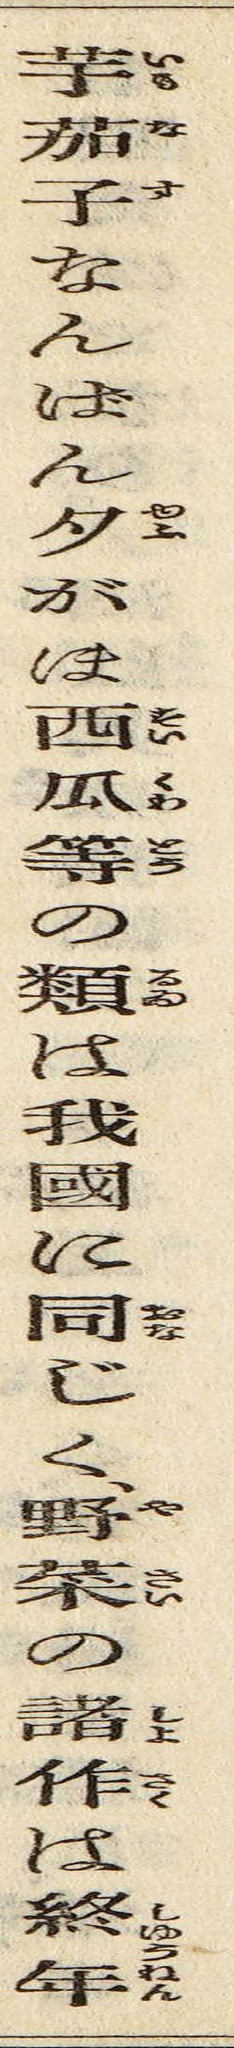芋茄子なんばん夕がほ西瓜等の類は我国に同じく、野菜の諸作は終年
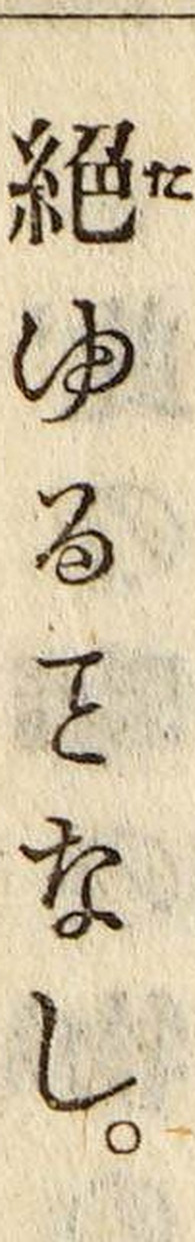絶ゆることなし。

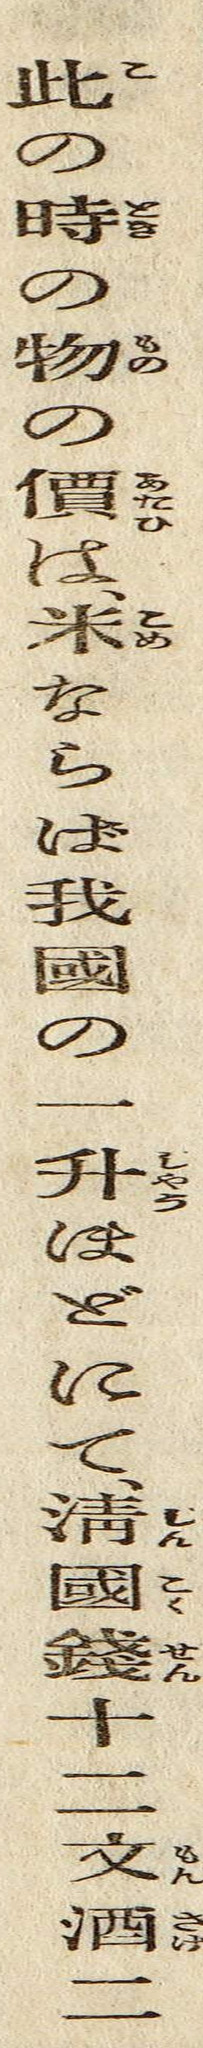此の時の物の価は、米ならば我国の一升ほどにて、清国銭十二文酒二
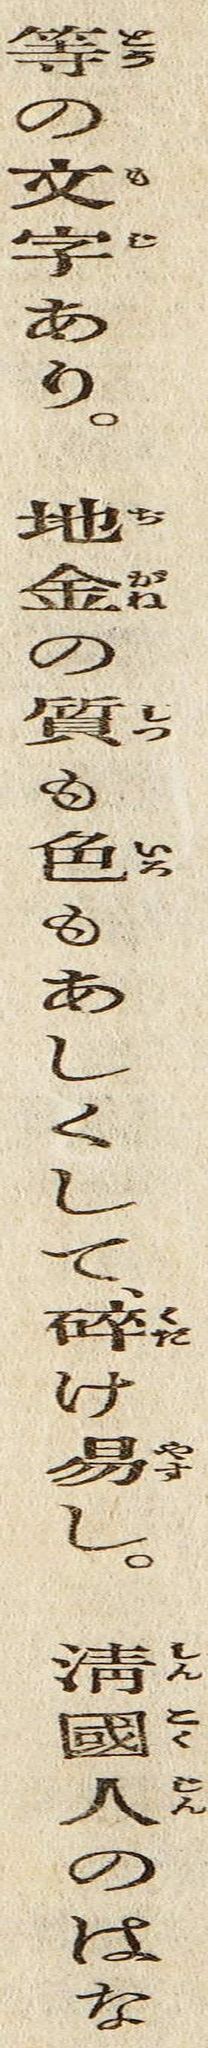等の文字あり。地金の質も色もあしくして、砕け易し。清国人のはな
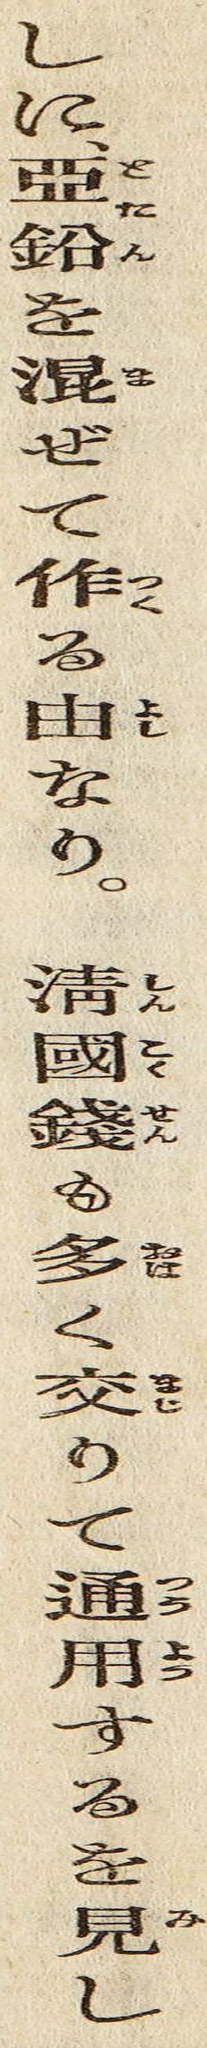しに、亜鉛を混ぜて作る由なり。清国銭も多く交りて通用するを見し
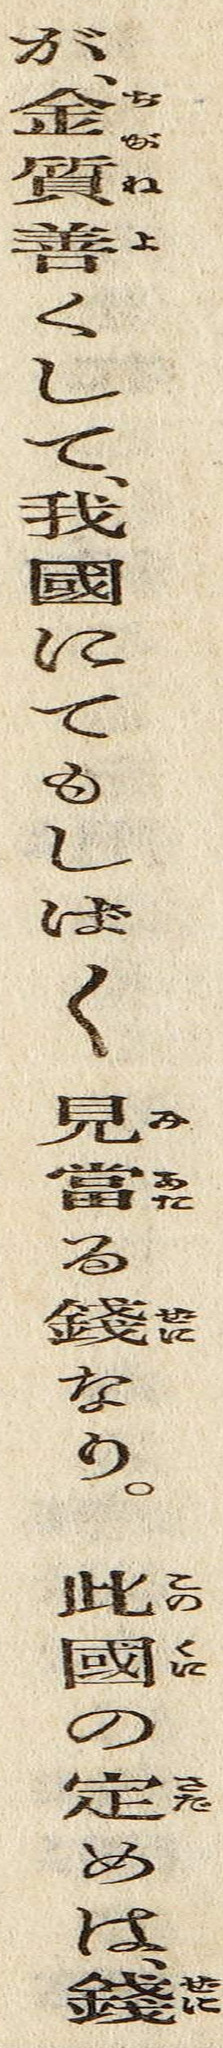が、金質善くして、我国にてもしば〳〵見当る銭なり。此国の定めは、銭
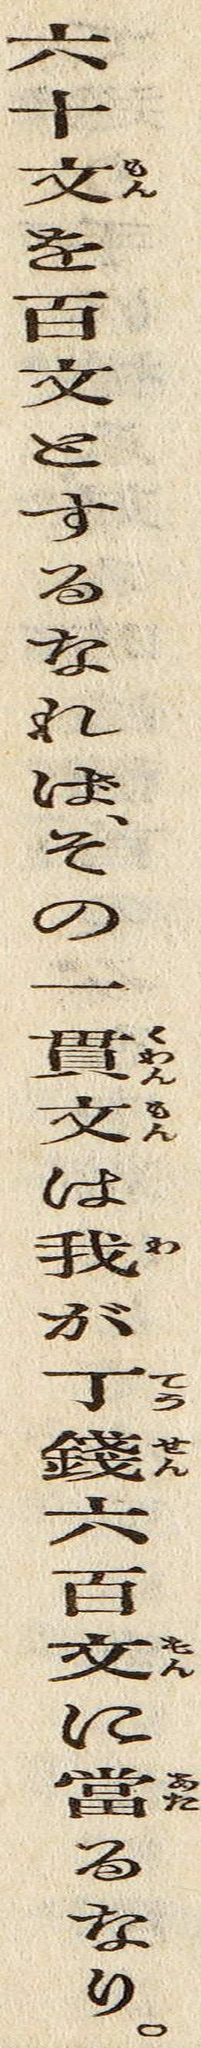六十文を百文とするなれば、その一貫文は我が丁銭六百文に当るなり。
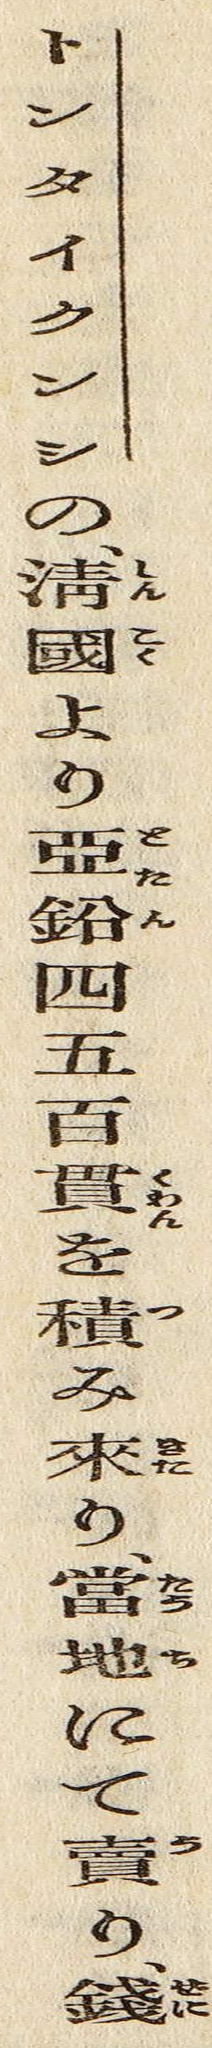トンタイクンシの、清国より亜鉛四五百貫を積み来り、当地にて売り、銭
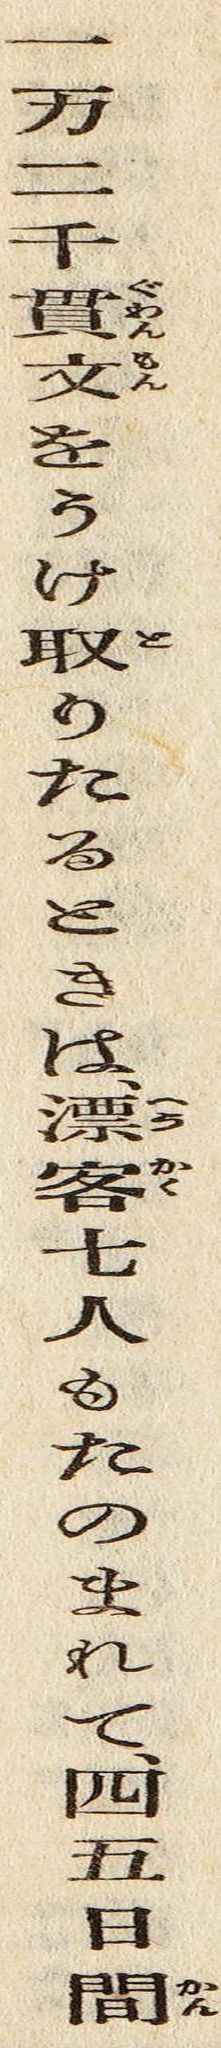一万二千貫文をうけ取りたるときは、漂客七人もたのまれて、四五日間
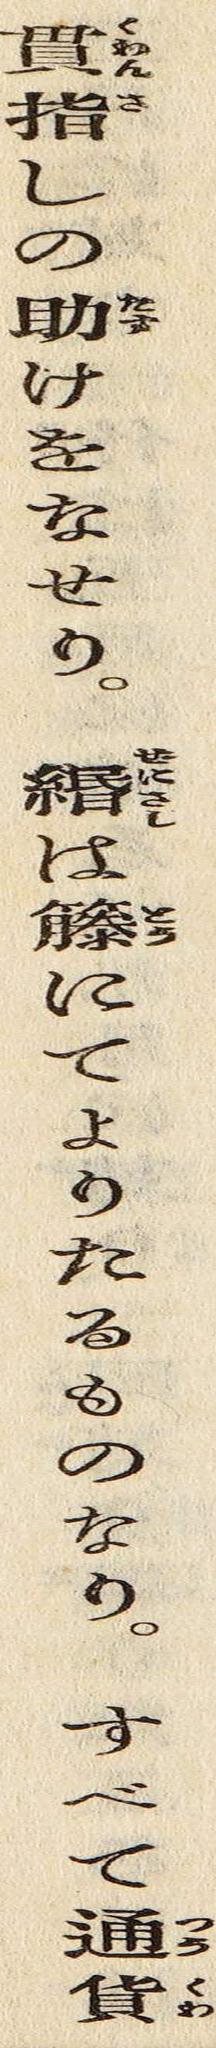貫指しの助けをなせり。緡は籐にてよりたるものなり。すべて通貨
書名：日本漂流譚
